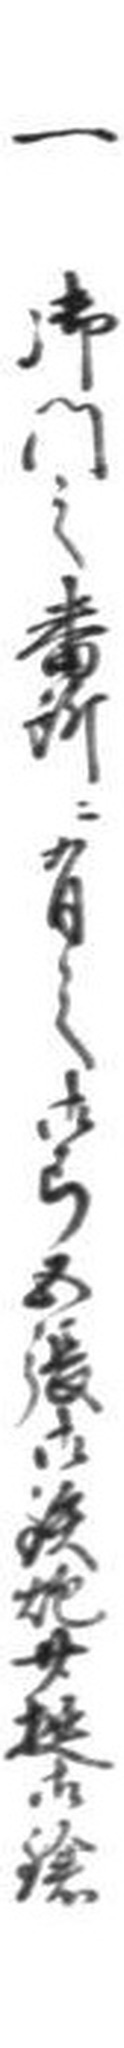一御門之番所ニ有之御弓五張鉄炮廿挺御鎗

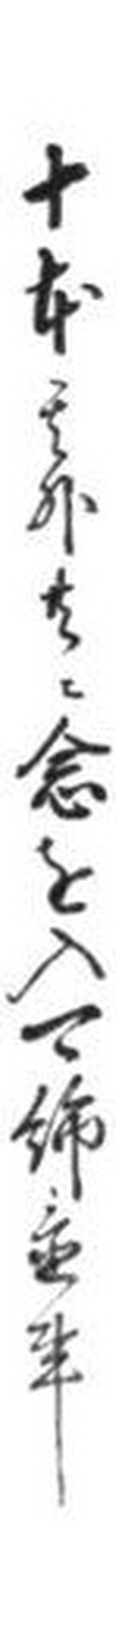十本其外共ニ念を入可飾置事
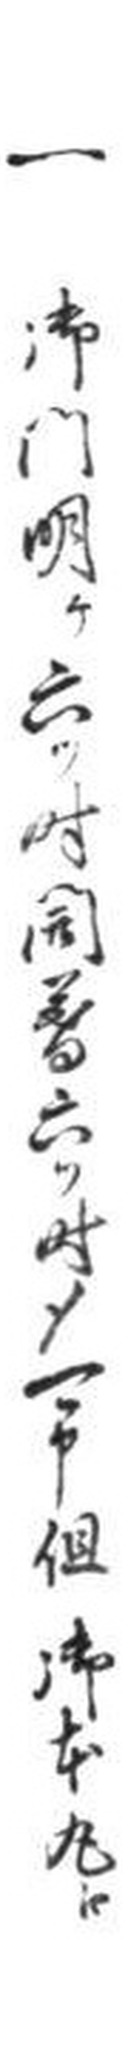一御門明ケ六ツ時開暮六ツ時〆可申但御本丸江
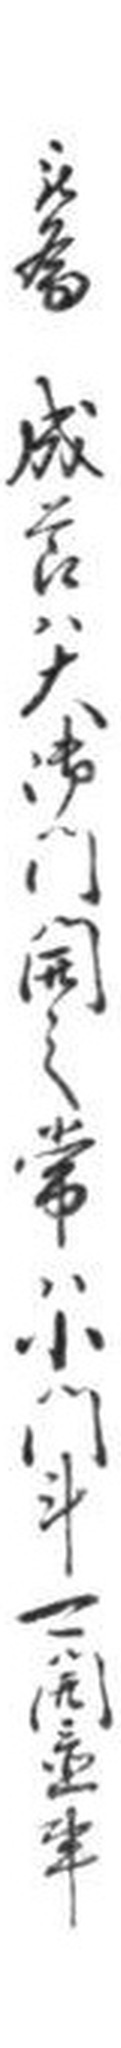被為成節ハ大御門開之常ハ小門斗可開置事
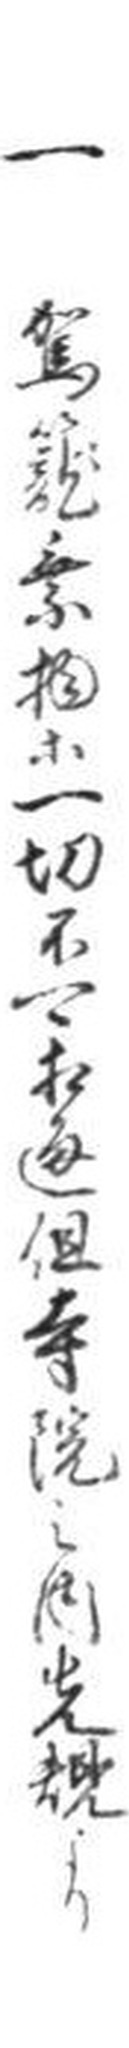一駕籠乗物等一切不可相通但寺院之内先規より
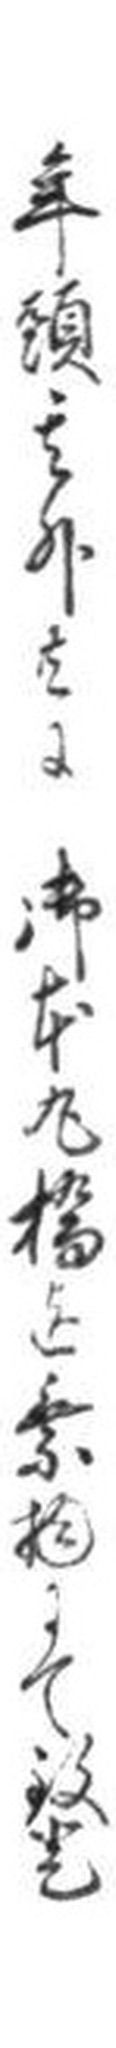年頭其外共に御本丸橋迄乗物にて致登
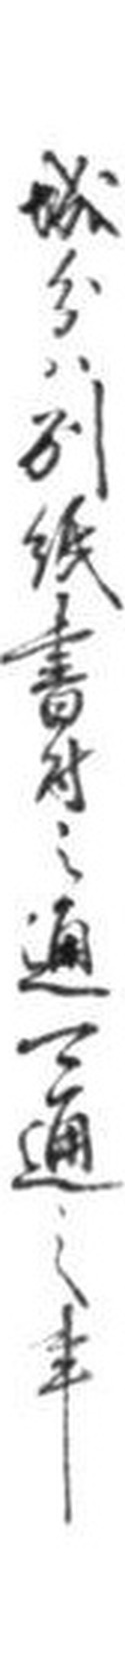城分ハ別紙書付之通可通之事
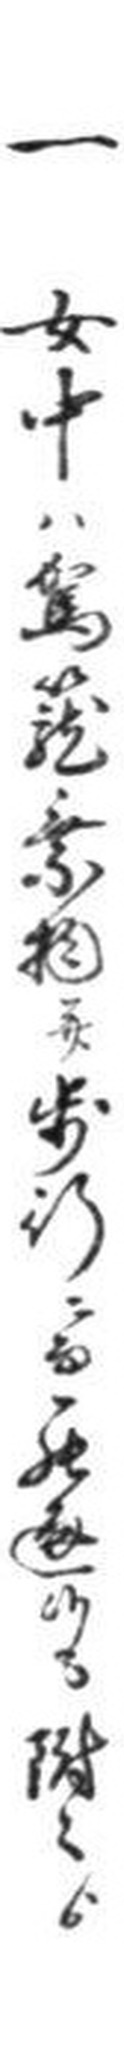一女中ハ駕籠乗物并歩行ニ而罷通候而付々ゟ
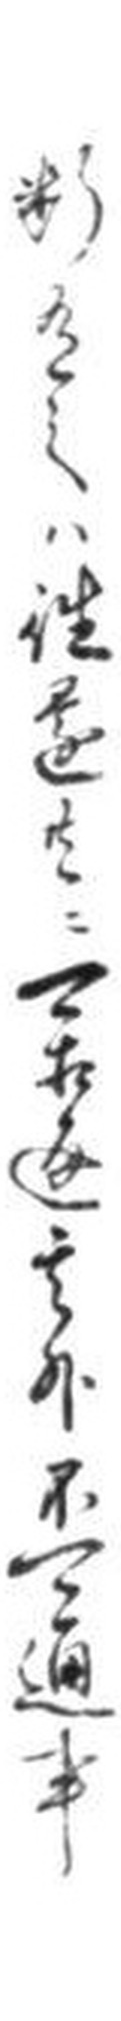断有之ハ往還共ニ可相通其外不可通事
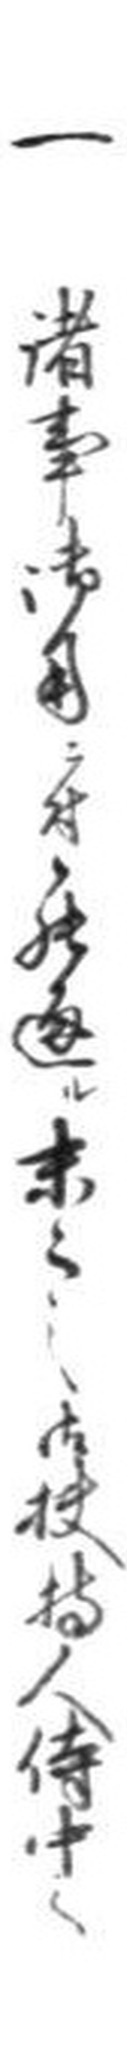一諸事御用ニ付罷通ル末々之御扶持人侍中之
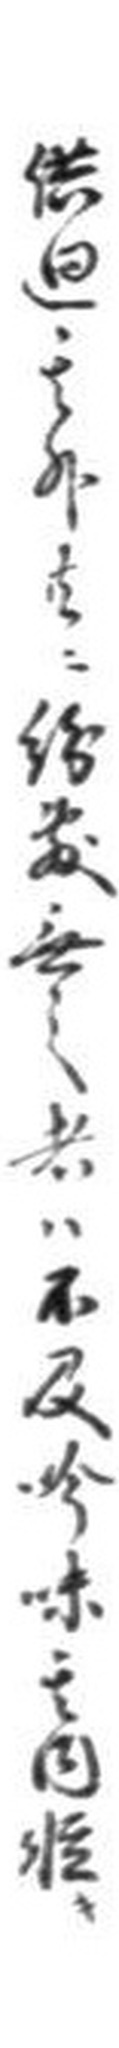供廻其外共ニ紛敷無之者ハ不及吟味其内軽キ
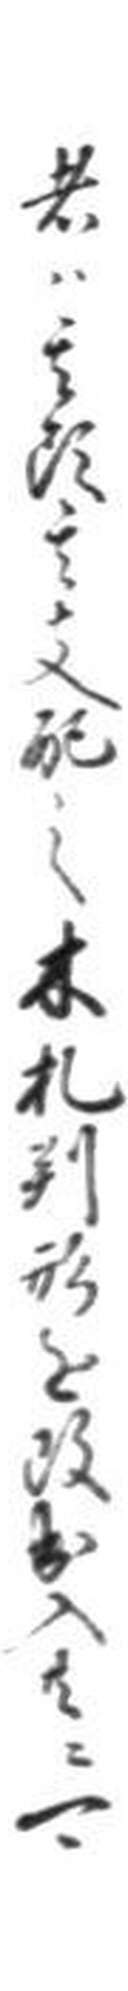者ハ其頭其支配之木札判形を改出入共ニ可
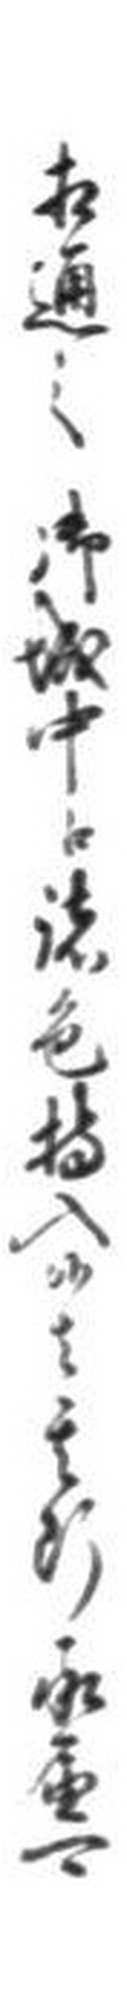相通之御城中江諸色持入候者其断承届可
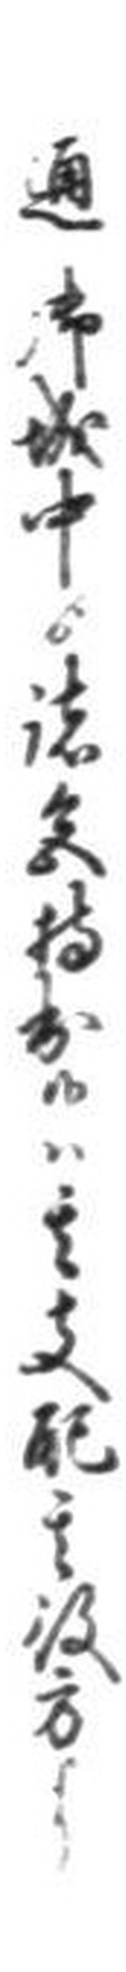通御城中ゟ諸色持出候ハ其支配其役方より
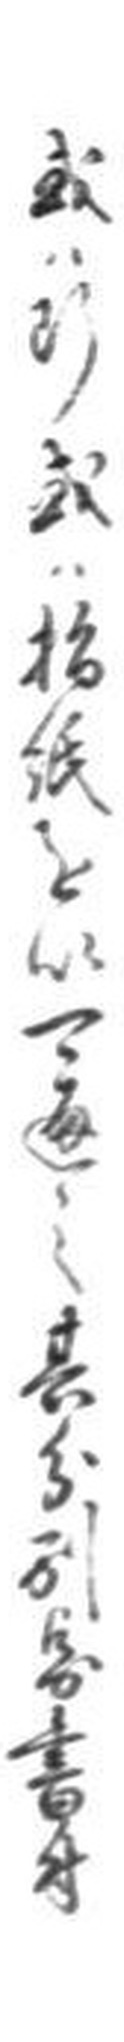或ハ断或ハ指紙を以可通之其分別紙書付
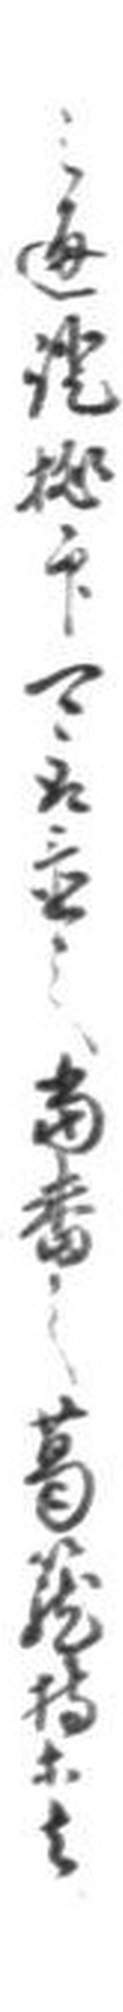之通証拠印可取置之当番之葛籠持等者
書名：家譜 三十三 吉邦公 享保四年
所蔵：福井県文書館 Fukui Prefectural Archives
